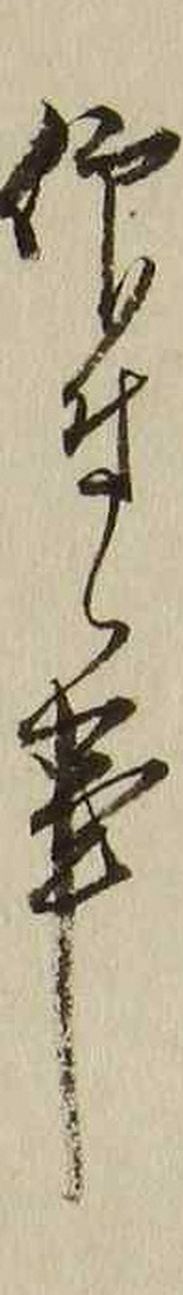仰付候事
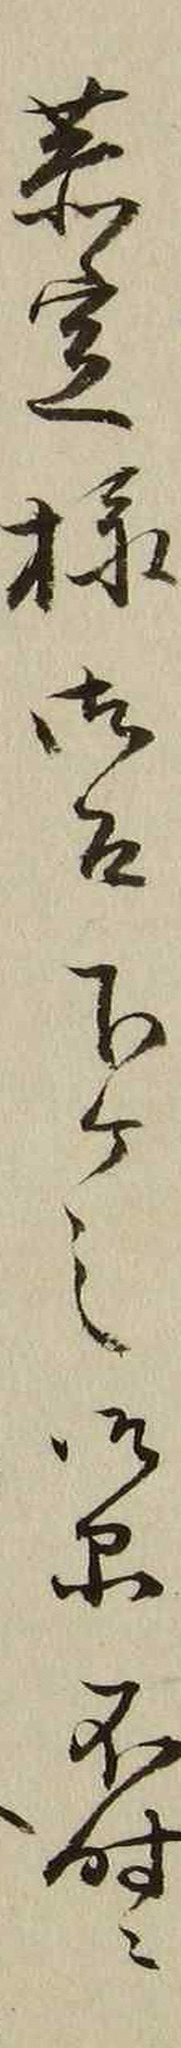恭定様御召下け之御品不時に
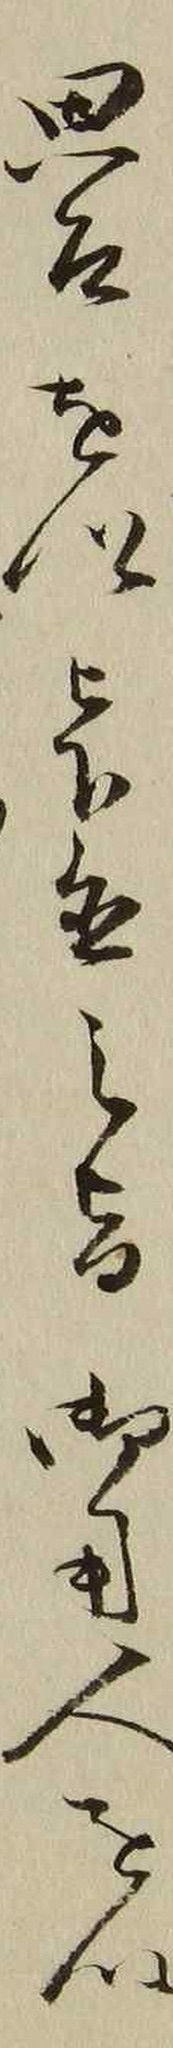思召を以被下置之旨御用人を以
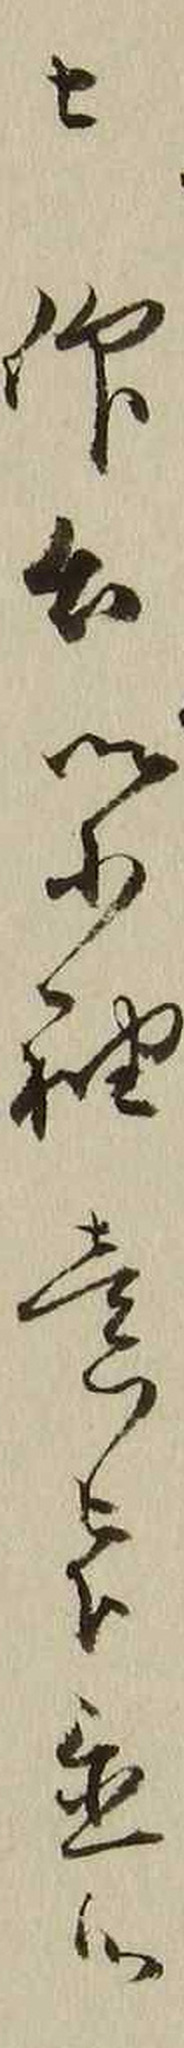被仰出御小袖壱つ被下置候
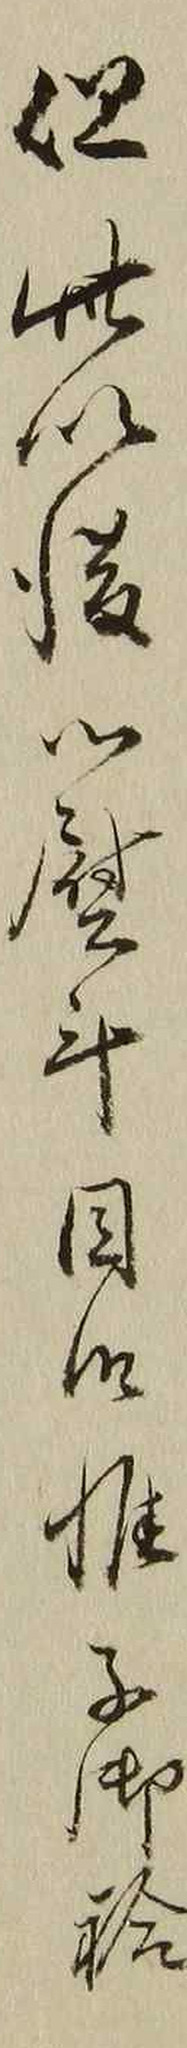但此以後御熨斗目御帷子御袷
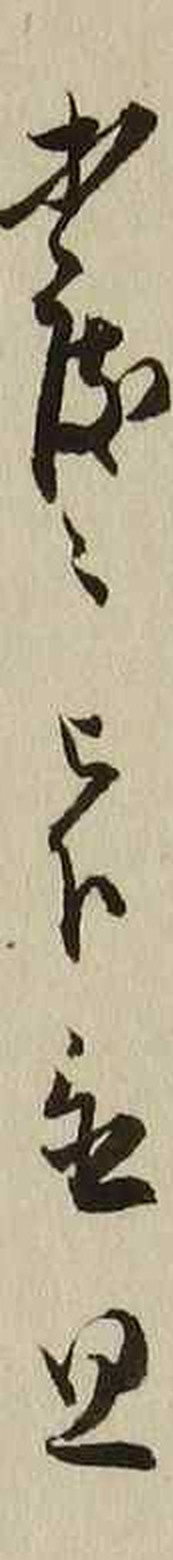等度々被下置且
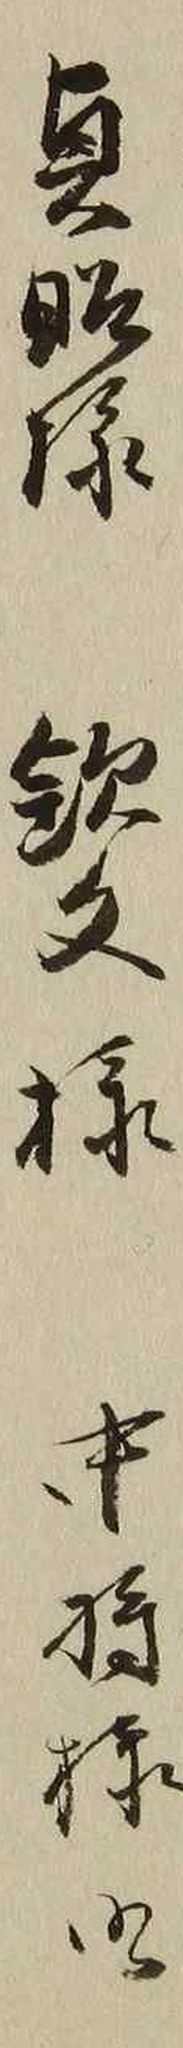貞昭様欽文様中将様御
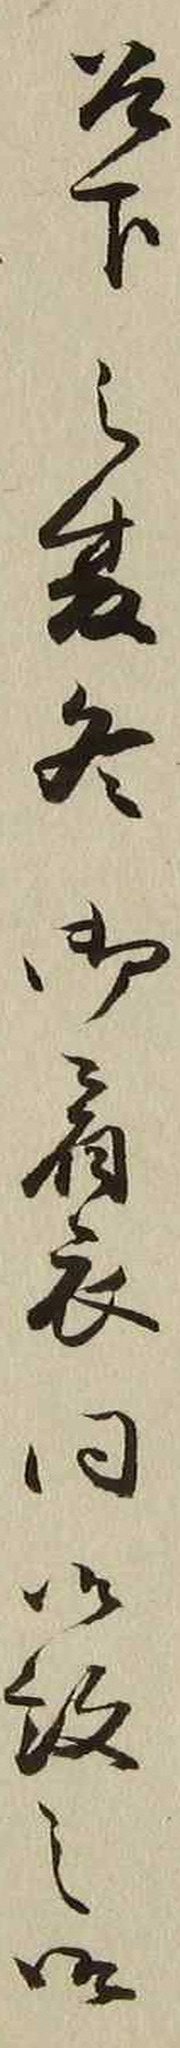召下之夏冬御肩衣同御紋之御
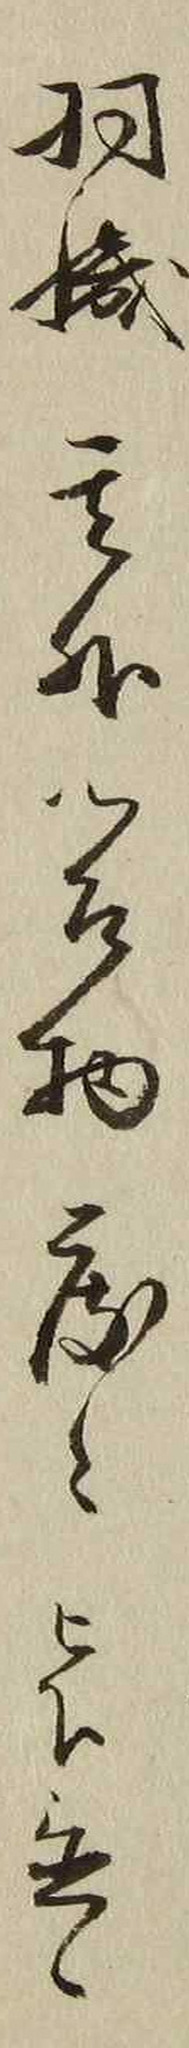羽織其外御召物度々被下置候
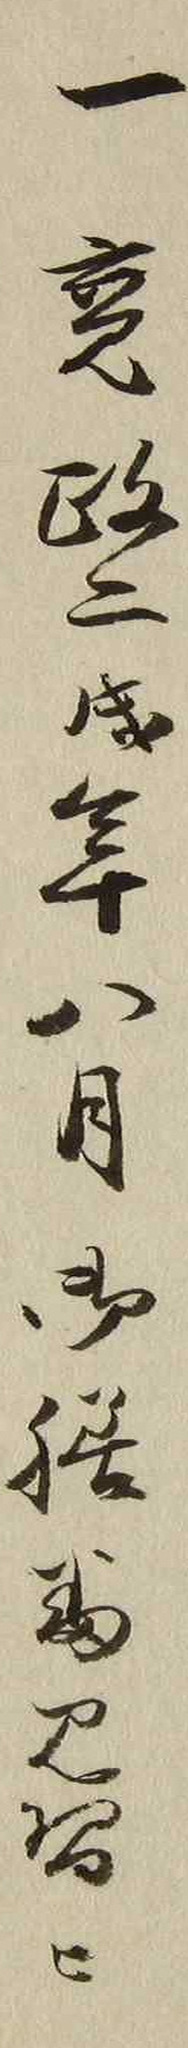一寛政二戌年八月御膳番見習被
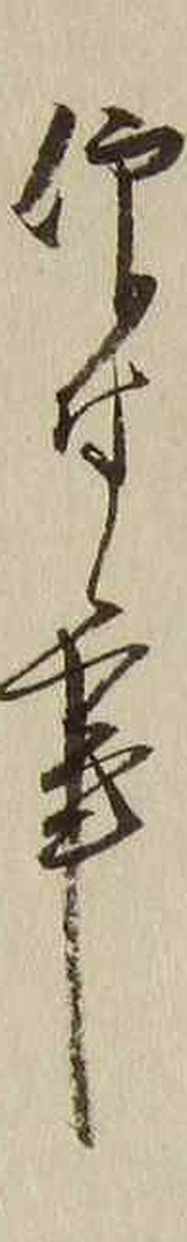仰付候事
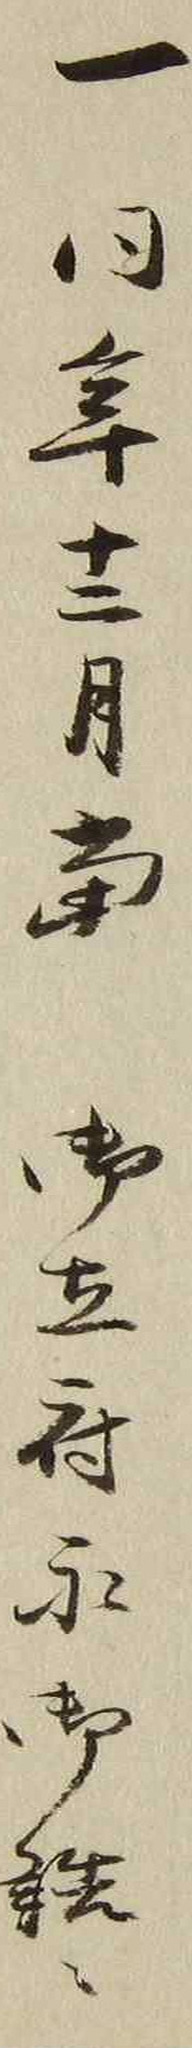一同年十二月当御在府永御詰に
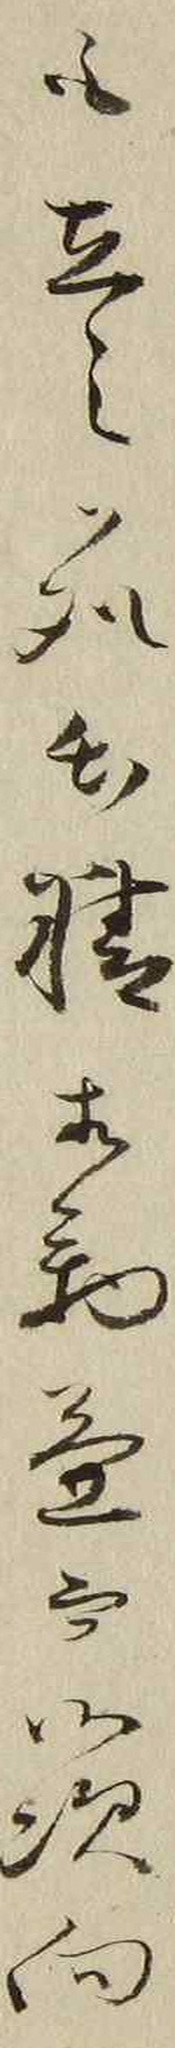も在之候処出精相勤兼而御次向
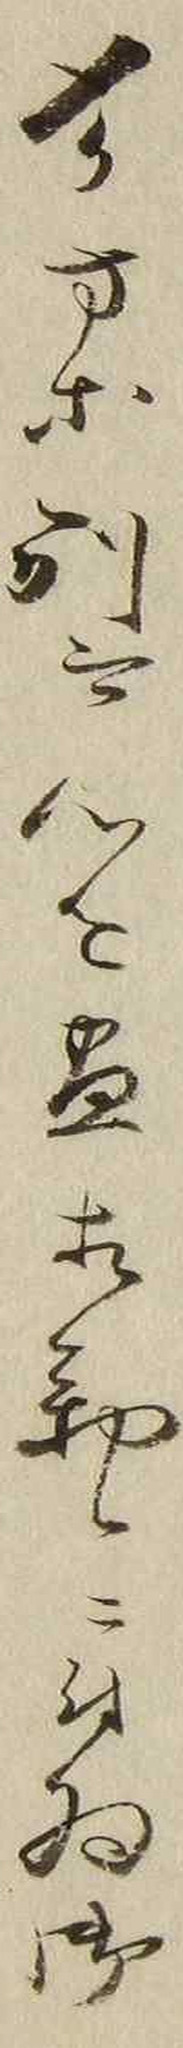〆り方等別而心を尽相勤候に付為御
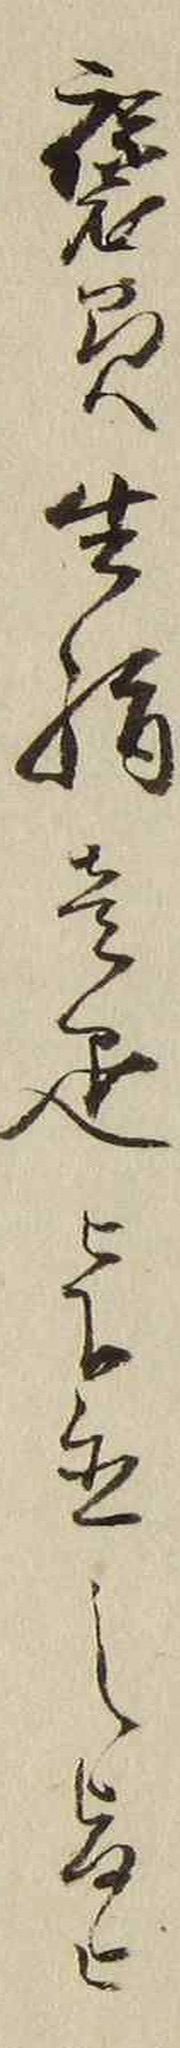褒美生絹壱疋被下置之旨被
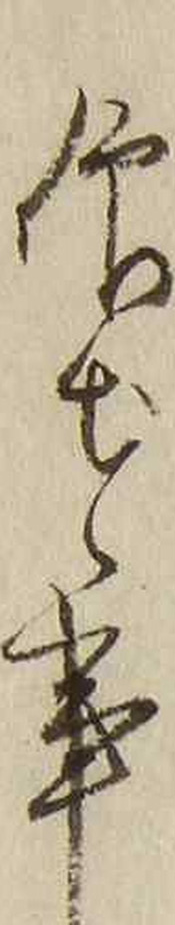仰出候事
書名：諸士系譜　巻之292　き之部1
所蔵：会津若松市立会津図書館
